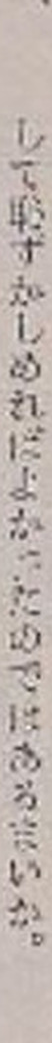して恥ずかしめればよかったのではあるまいか。
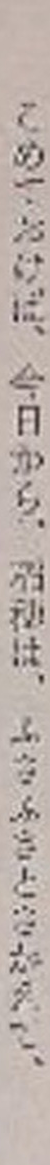こめておけば、今日から、稲穂は、ふさふさとさかえて、
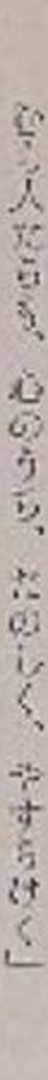むら人たちも、心のうち、たのしく、やすらけく」
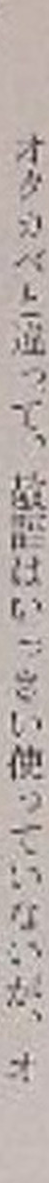オタカベと違って、敬語はいっさい使っていないが、オ
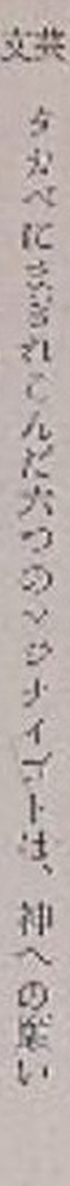タカベにまぎれこんだ六つのマジナイゴトは、神への願い
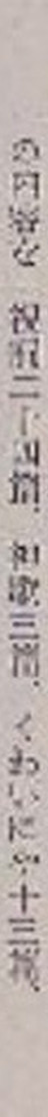の内容を「祝呪二十四篇、神歌三篇、くわいにや十三篇、
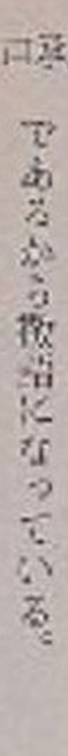であるから敬語になっている。
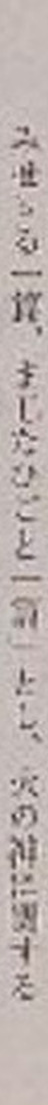みせせる一篇、まじなひごと一篇」とし、火の神に関する
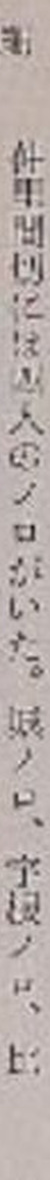仲里間切には四人のノロがいた。城ノロ、宇根ノロ、比
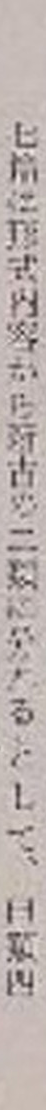七篇は形式内容から新古の二類にるとして、甲類四
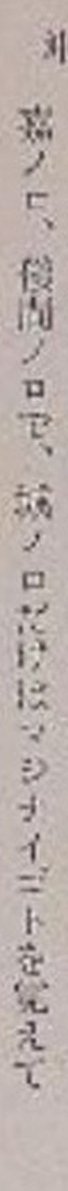嘉ノロ、儀間ノロで、城ノロだけはマジナイゴトを覚えて
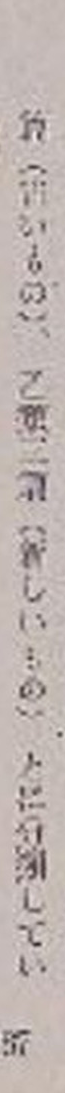篇(古いもの)、乙類三篇(新しいもの)とに分類してい

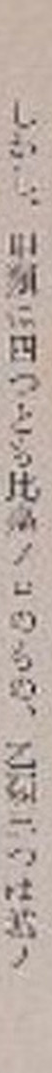しかし、甲類は四つとも比嘉ノロのもの、乙類三つは城ノ
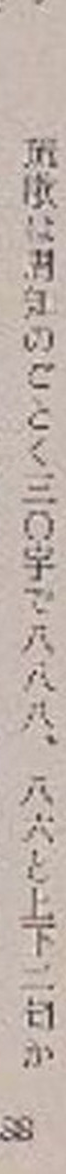琉歌は周知のごとく三〇字で八八八、八六と上下二句か
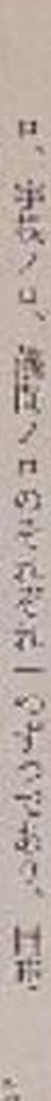ロ、宇根ノロ、儀間ノロのそれぞれ一つずつであり、
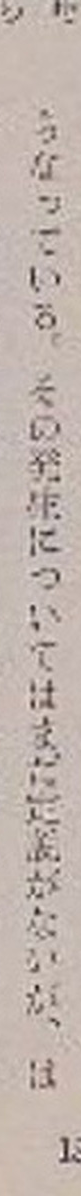らなっている。その発生についてはまだ定義がないが、は
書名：沖縄口承文芸
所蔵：University of the Ryukyus Library
